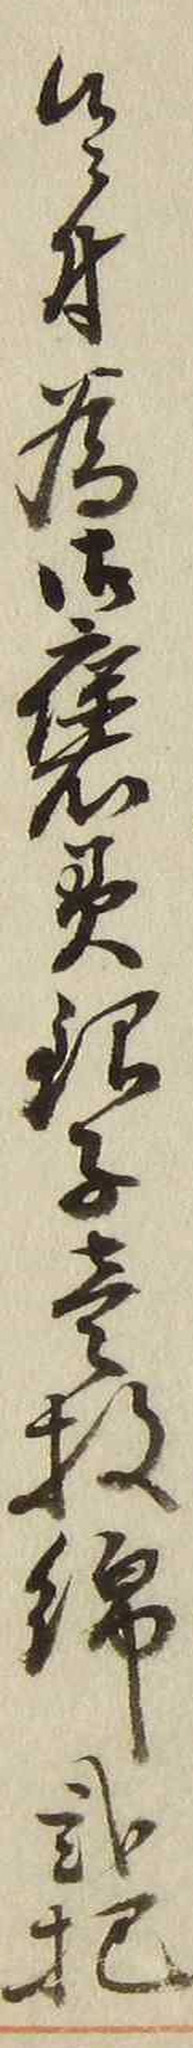候ニ付為御褒美銀子壱枚綿弐把
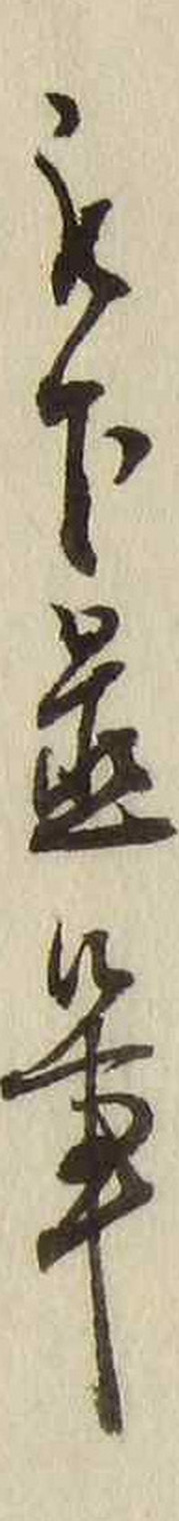被下置候事

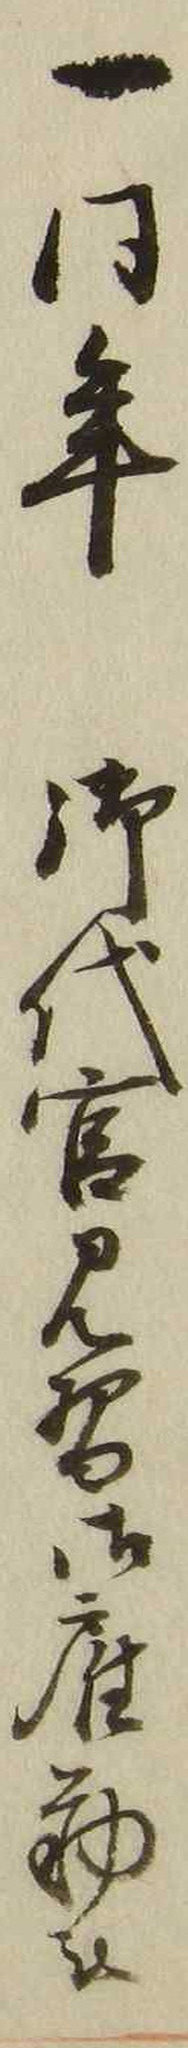一同年御代官見習御雇勤被
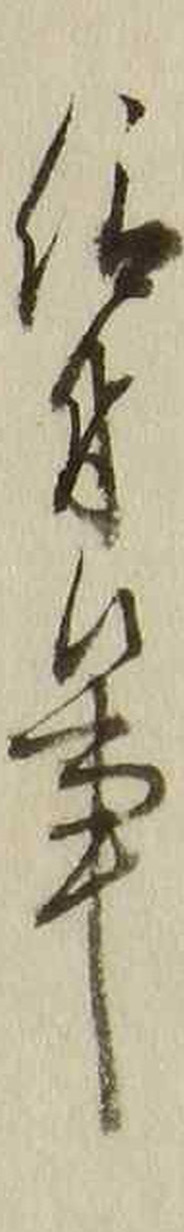仰付候事
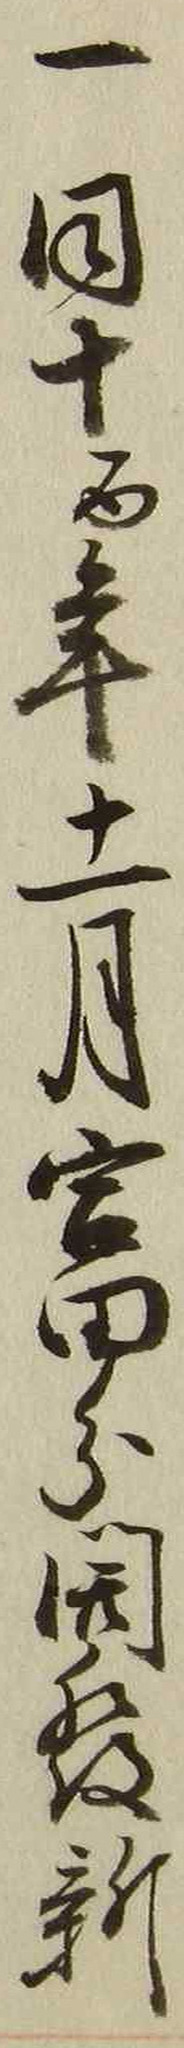一同十酉年十一月宮田分開発新
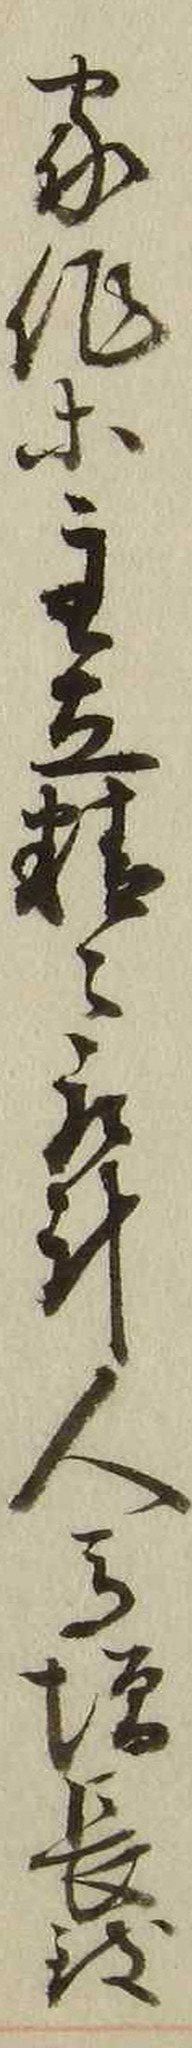家作等主立精々取計人馬増長致
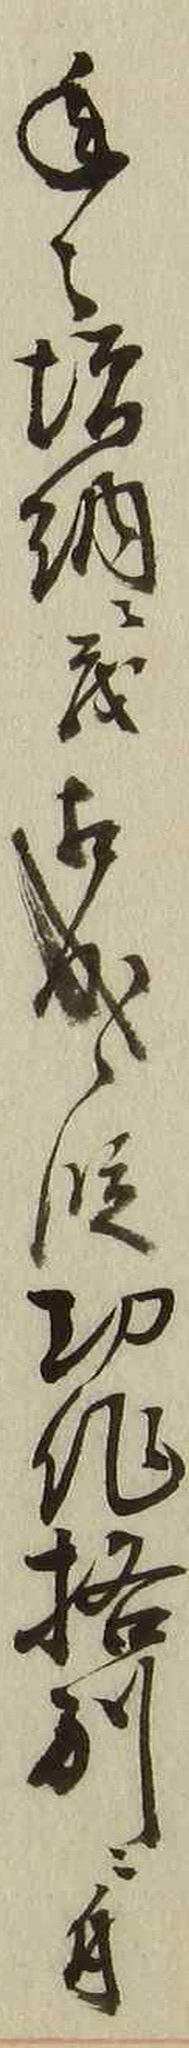年々増納ニ茂相成候段功作格別ニ付
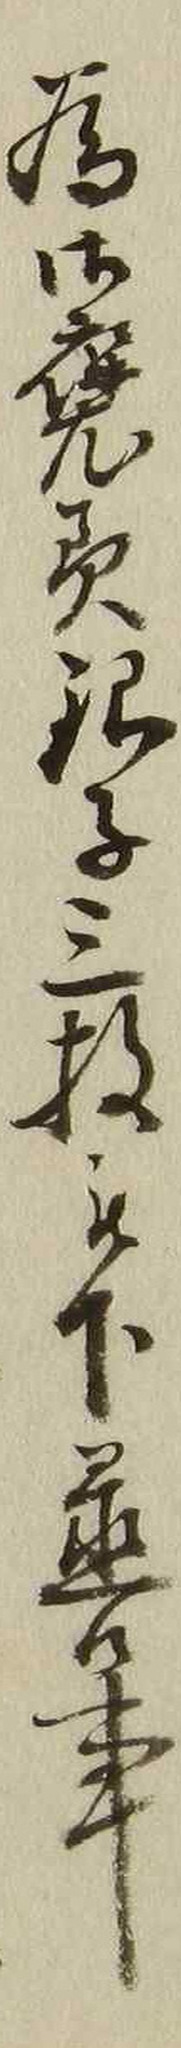為御褒美銀子三枚被下置候事
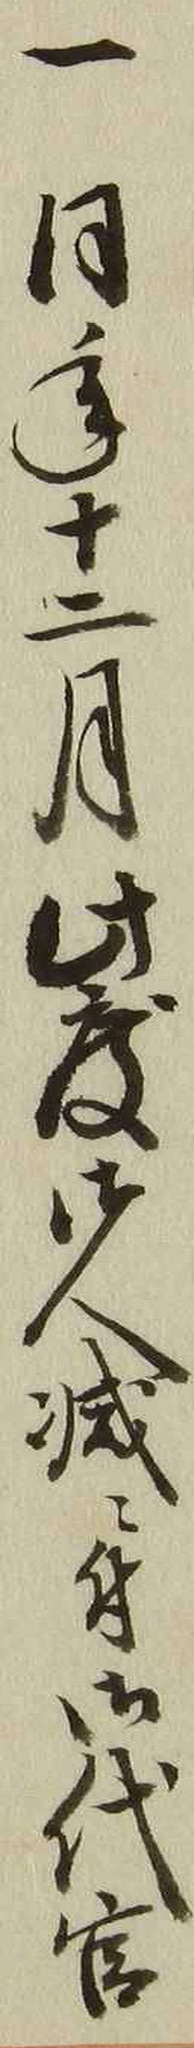一同年十二月此度御人減ニ付御代官
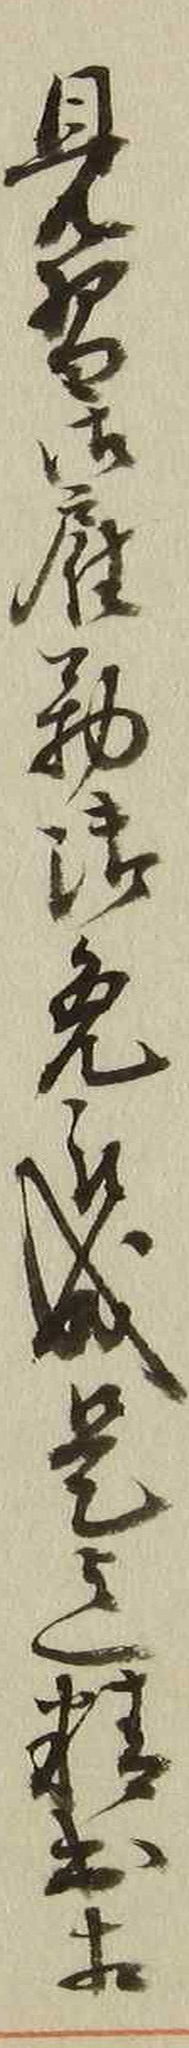見習御雇勤御免被成是迄精出相
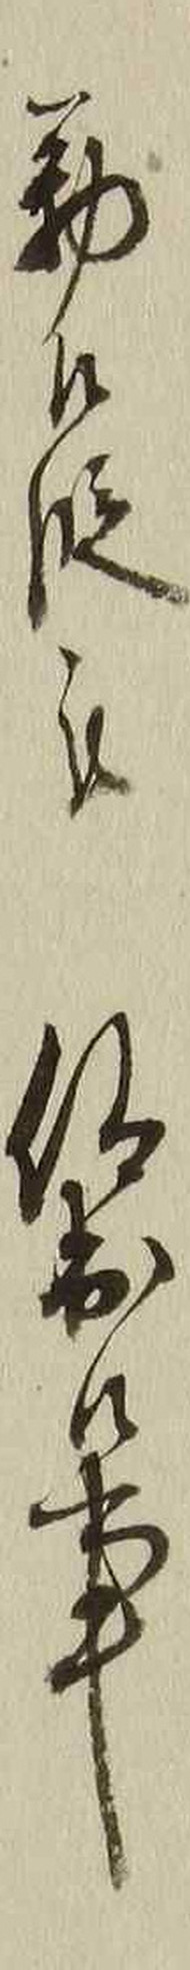勤候段被仰出候事
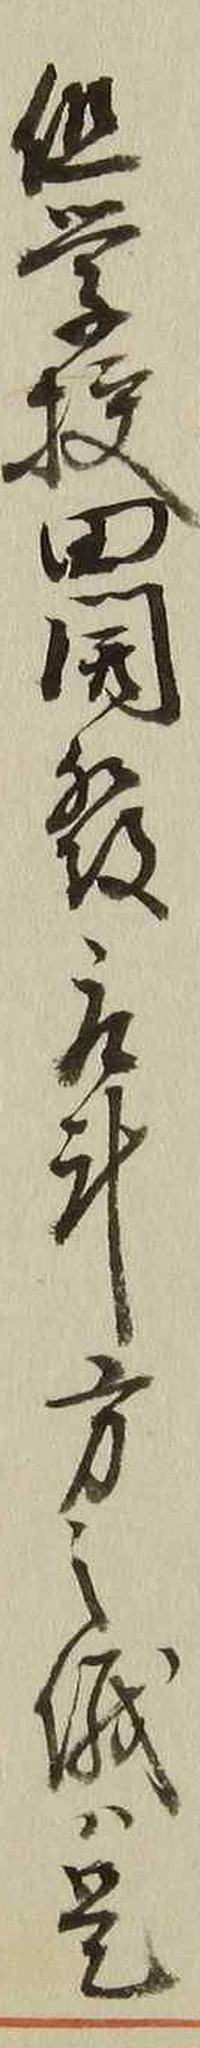但学校田開発取計方之儀ハ是
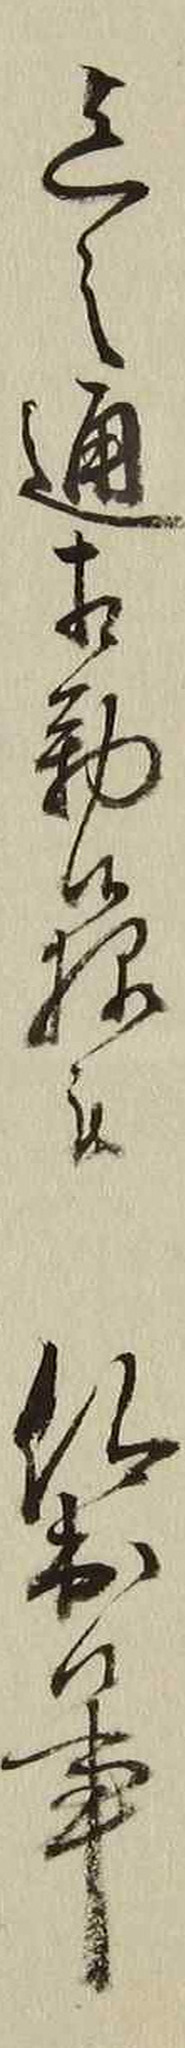迄之通相勤候様被仰出候事
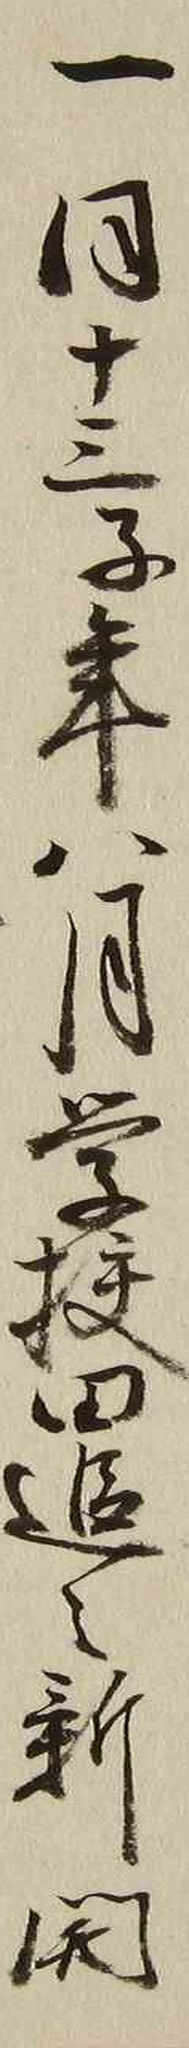一同十三子年八月学校田追々新開
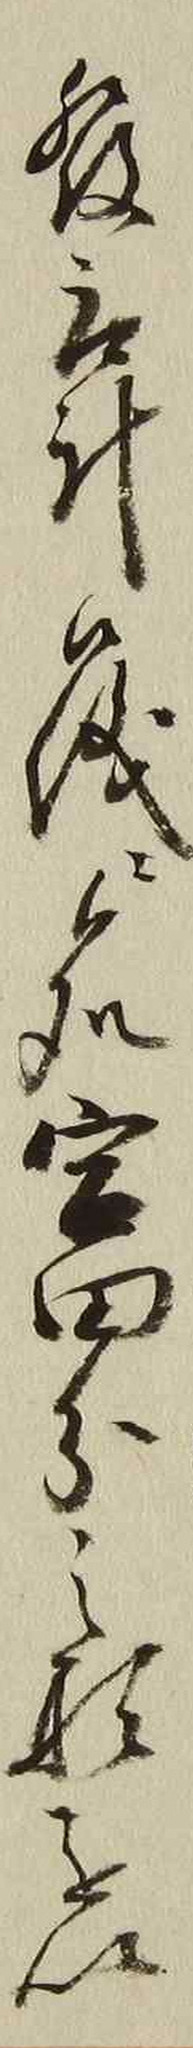発取計候儀ニ候処宮田分之形を以
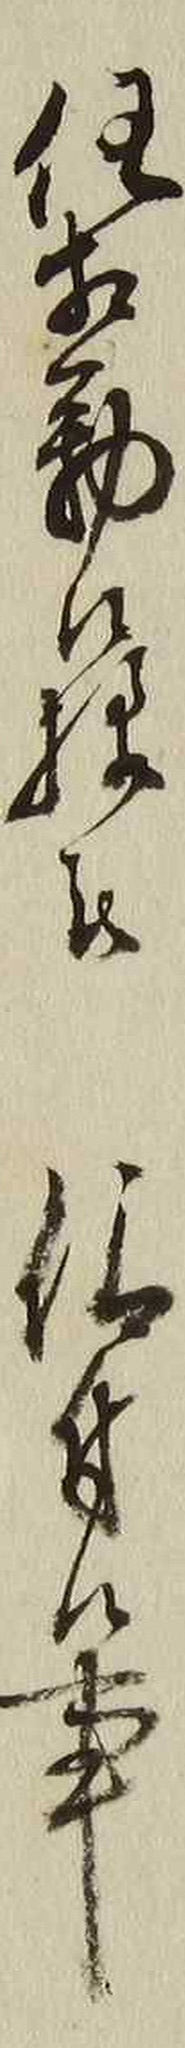任相勤候様被仰付候事
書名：諸士系譜　巻之27　い之部27
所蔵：会津若松市立会津図書館
